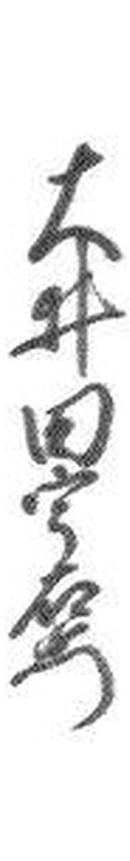大井田宇右衛門
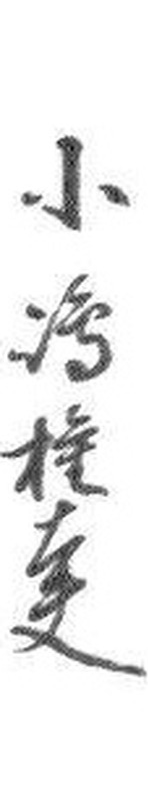小嶋権太夫
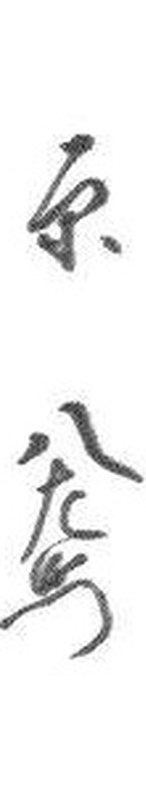原八左衛門
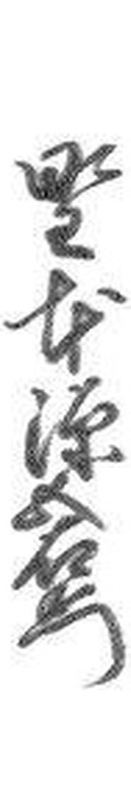野本源五右衛門
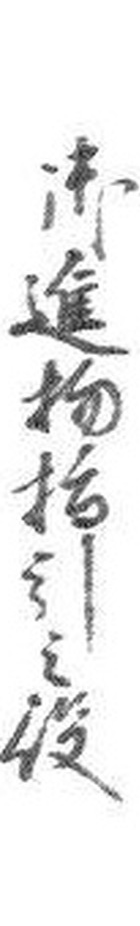御進物指引之役
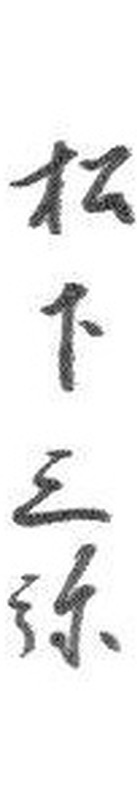松下三弥
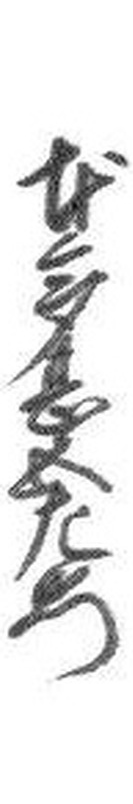本多甚五左衛門

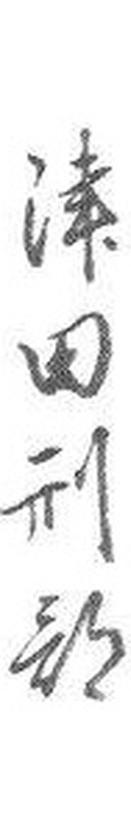津田刑部
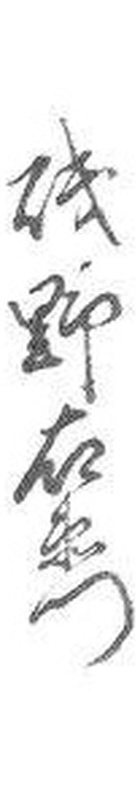磯野右衛門
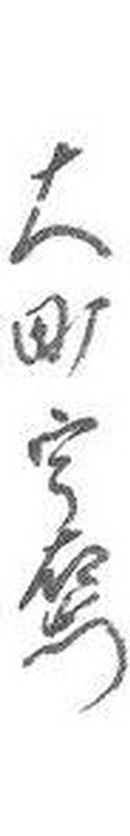大町宇右衛門
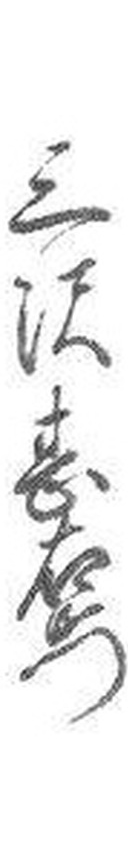三沢甚右衛門
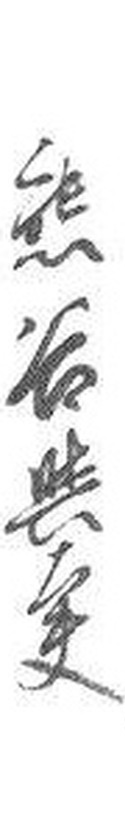熊谷与太夫
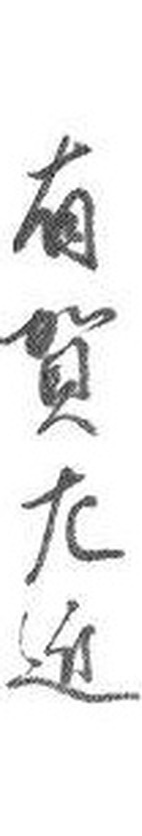有賀左近
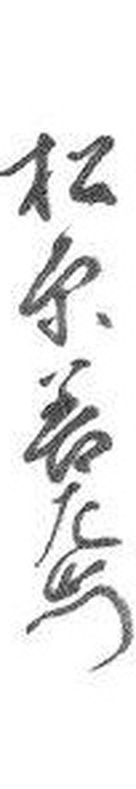松原善左衛門
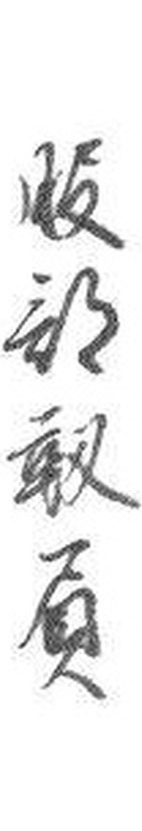服部靱負
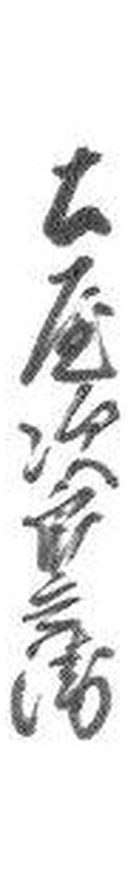土屋次郎兵衛
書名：家譜 四 忠昌公 従寛永七年到正保四年
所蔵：福井県文書館 Fukui Prefectural Archives
